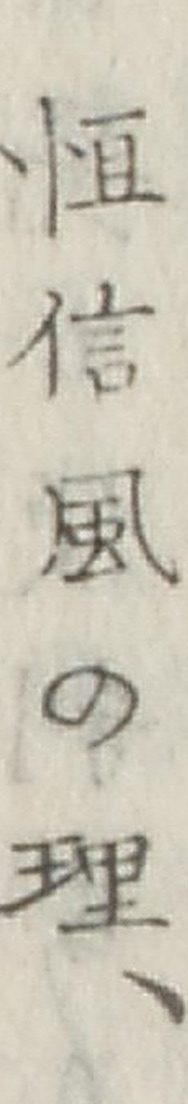恒信風の理、
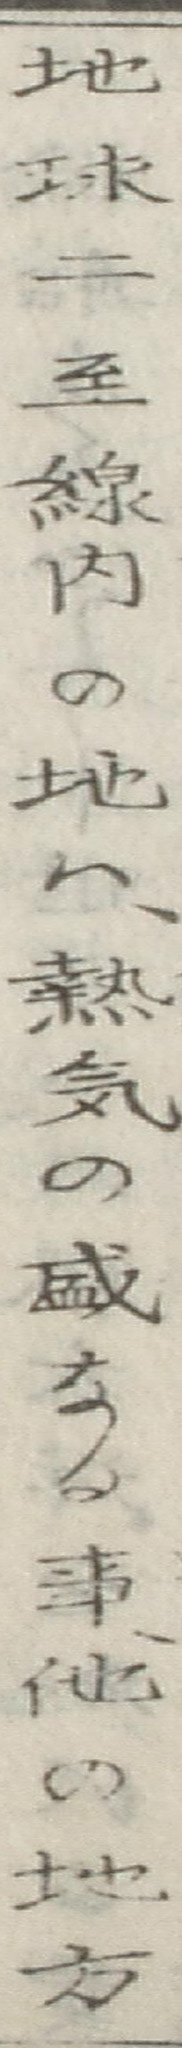地球の二至線内の地は、熱気の盛なる事、他の地方
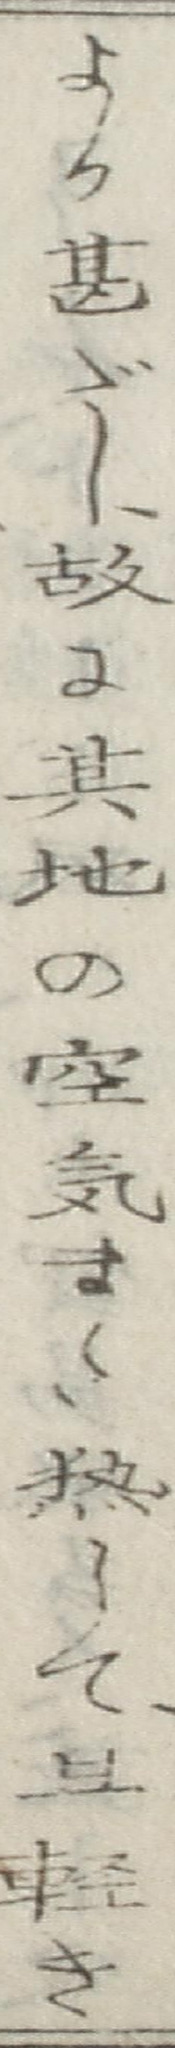より甚だし、故に其地の空気また熱して、且軽き
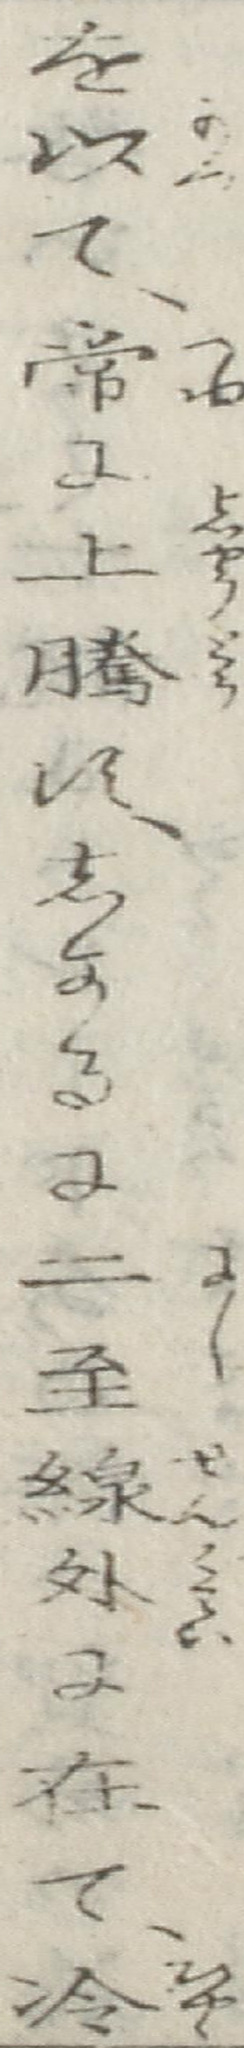を以て、常に上騰す、しかるに二至線外に在て、冷
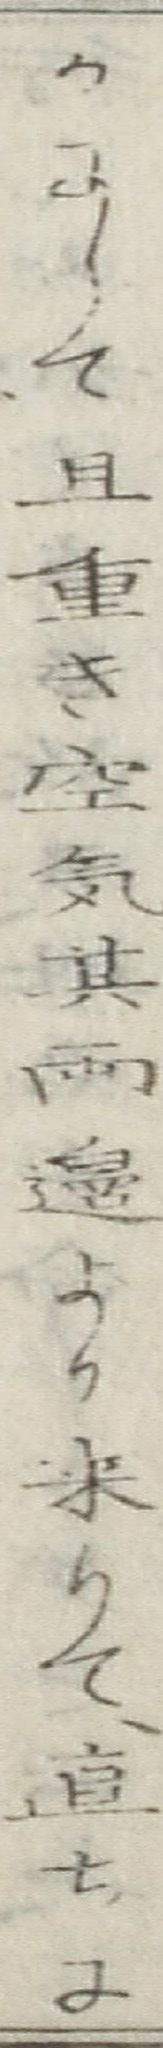かにして且重き空気、其両辺より来りて、直ちに
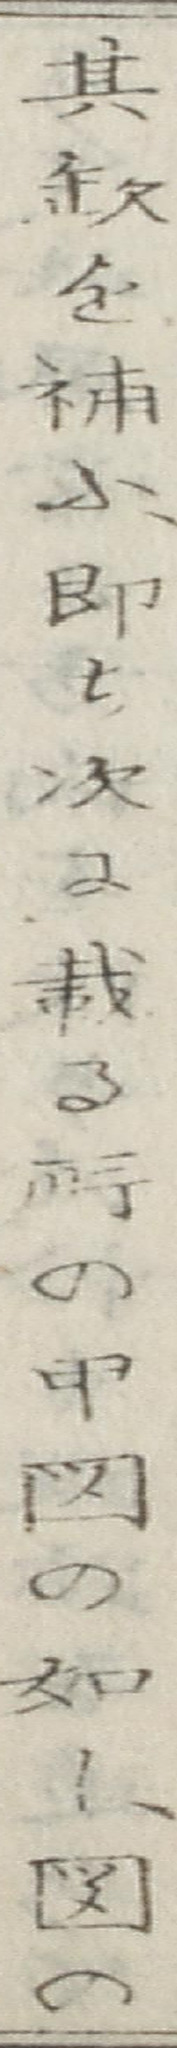其欠を補ふ、即ち次に載る所の甲図の如し、図の
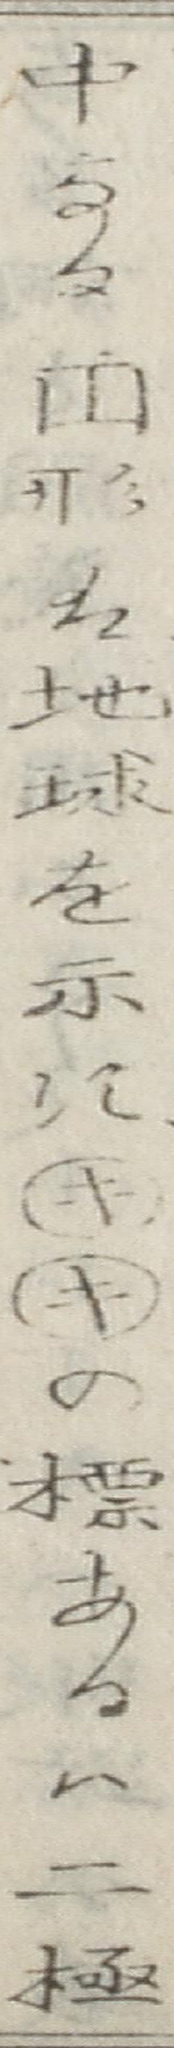中なる円形は、地球を示す、キキの標あるは二極

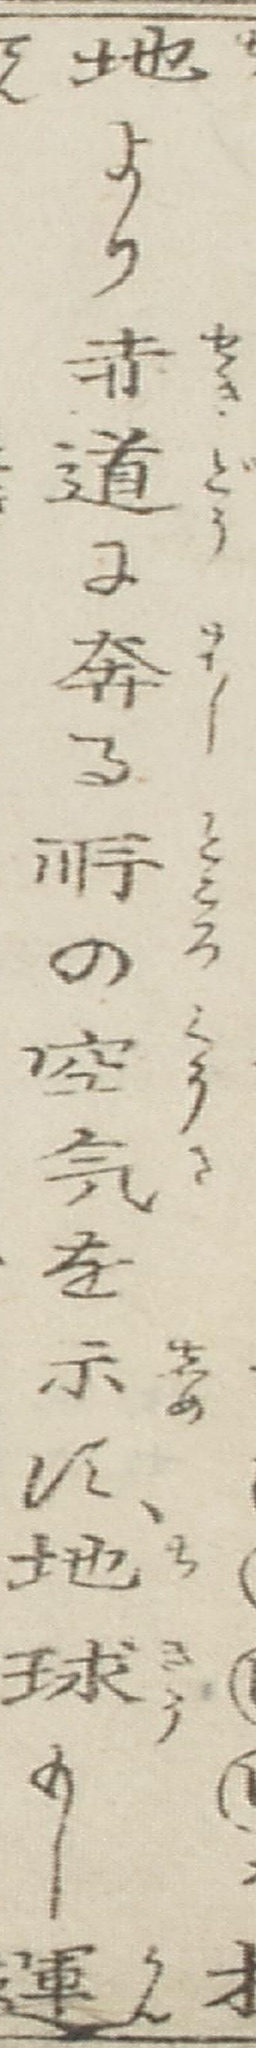地より赤道に奔る所の空気を示す、地球もし運
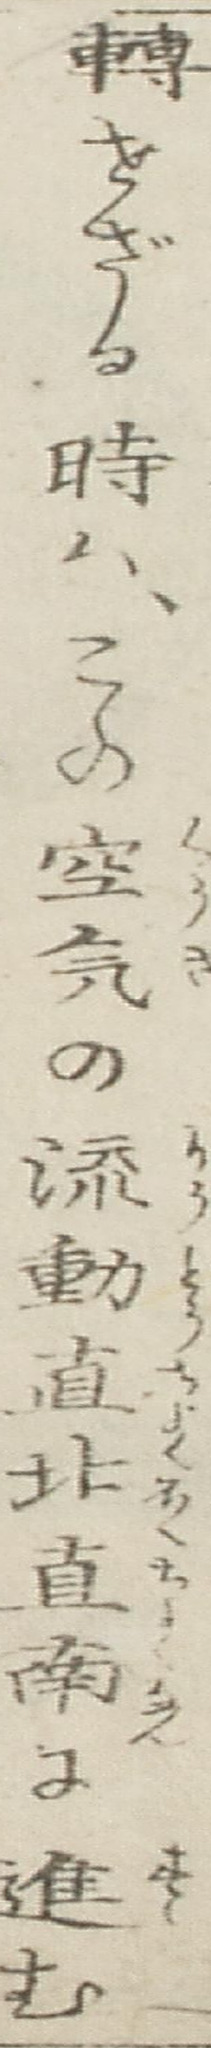転せざる時は、この空気の流動直北直南に進む
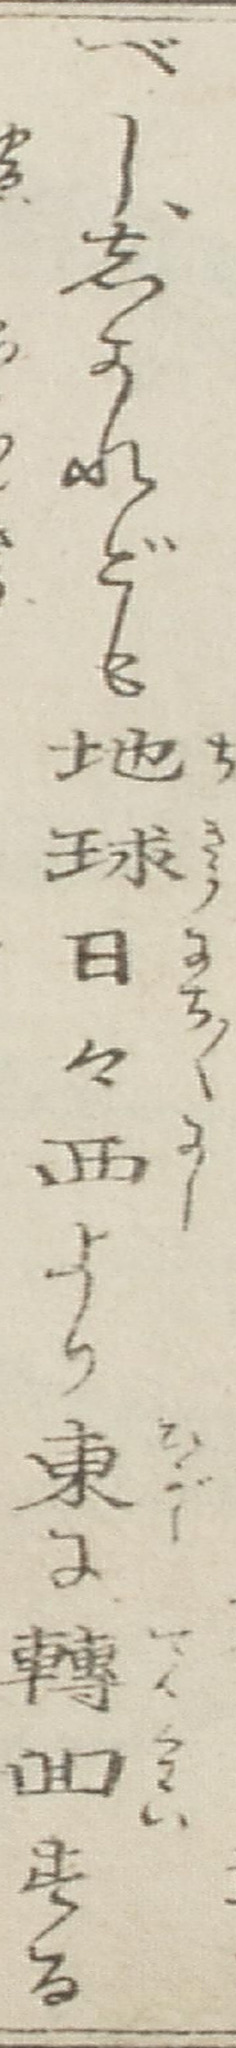べし、しかれども地球日々西より東に転回する
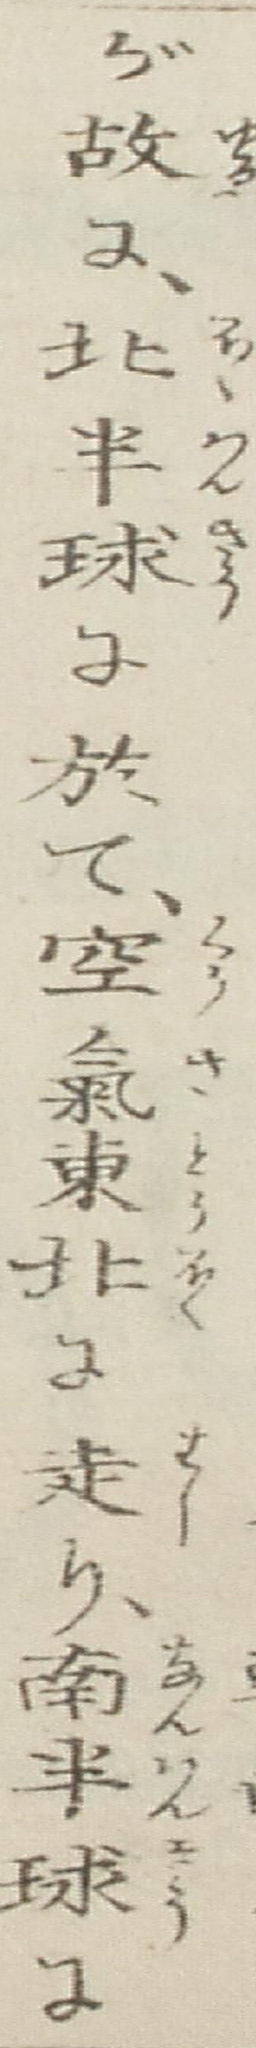が故に、北半球に於て、空気東北に走り、南半球に
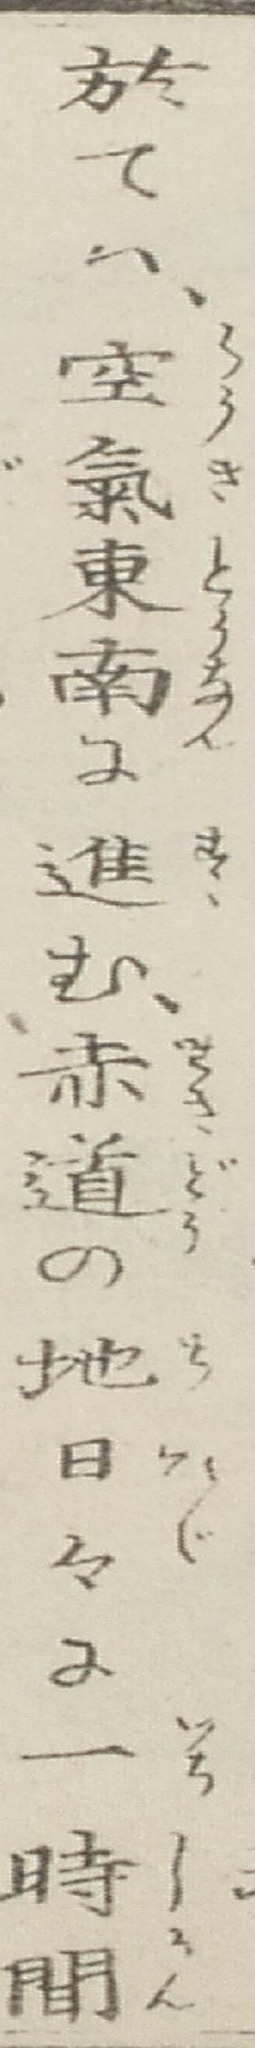於ては、空気東南に進む、赤道の地日々に一時間
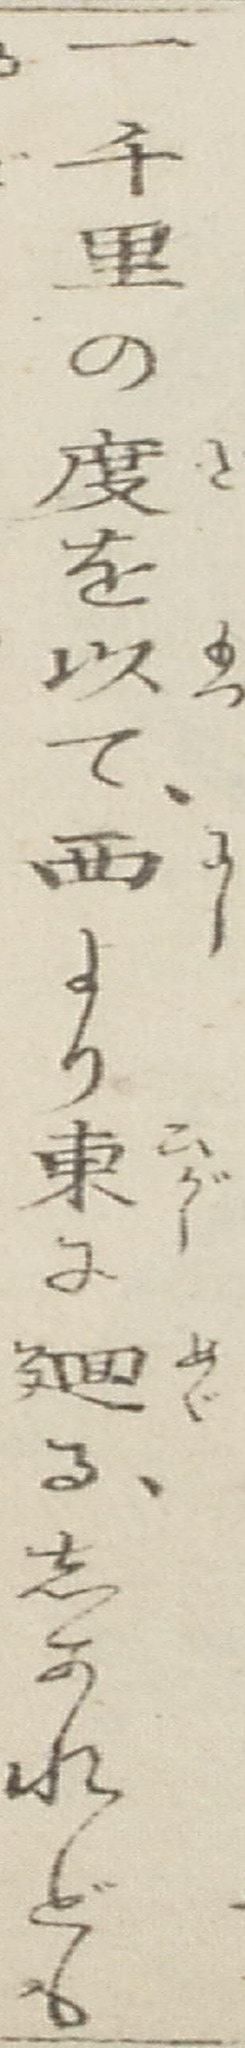一千里の度を以て、西より東に廻る、しかれども
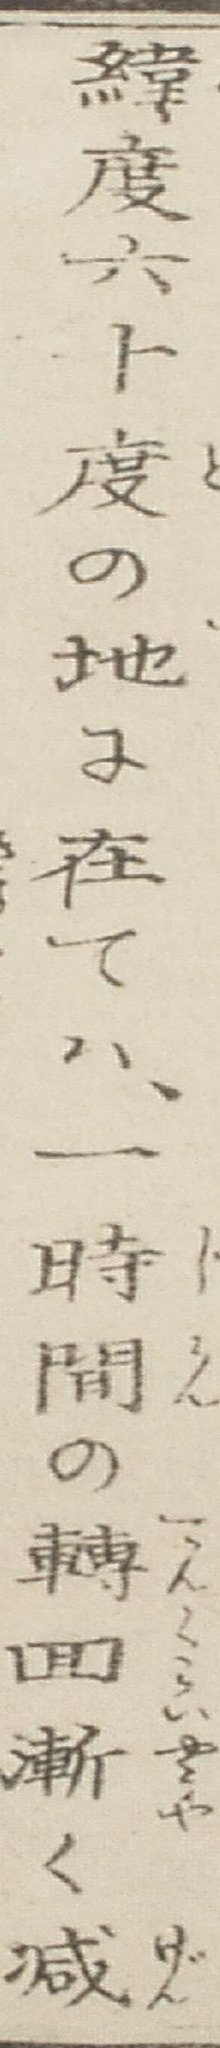緯度六十度の地に在ては、一時間の転回漸く減
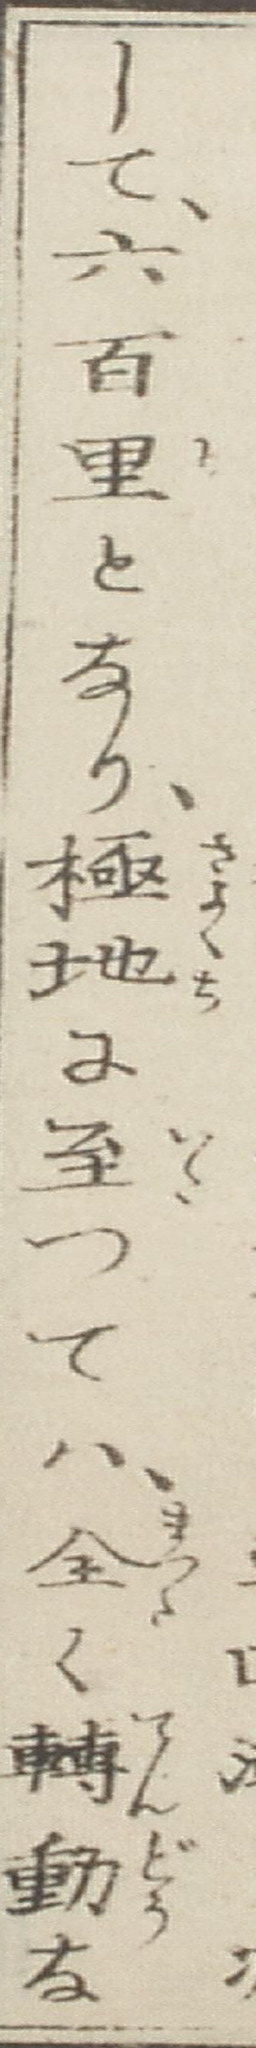して、六百里となり、極地に至つては、全く転動な
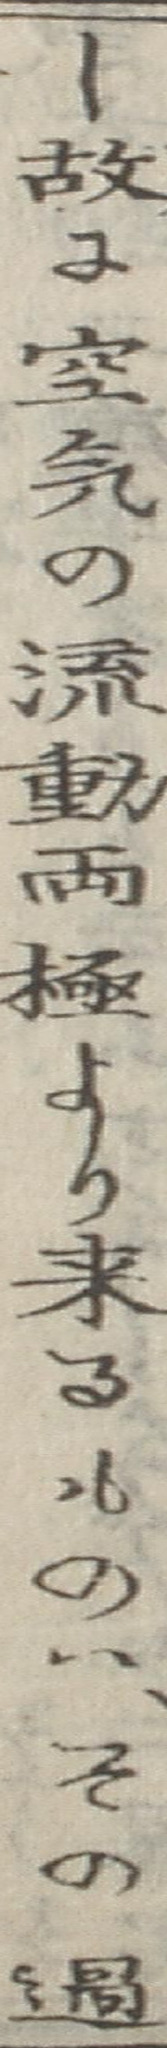し故に空気の流動両極より来るものは、その過
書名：訓蒙　天然地理學　中
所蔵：東京大学地震研究所図書室 Earthquake Research Institute Library, The University of Tokyo, JAPAN
